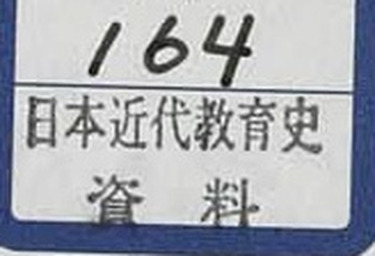日本近代教育史
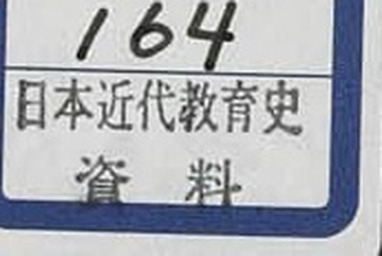日本近代教育史

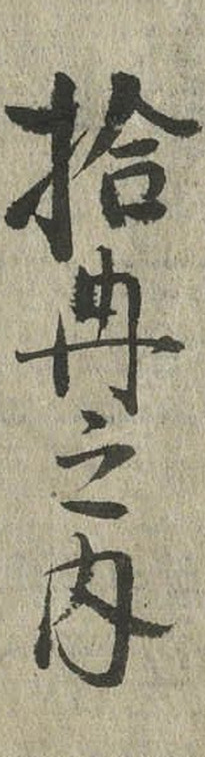拾冊之内
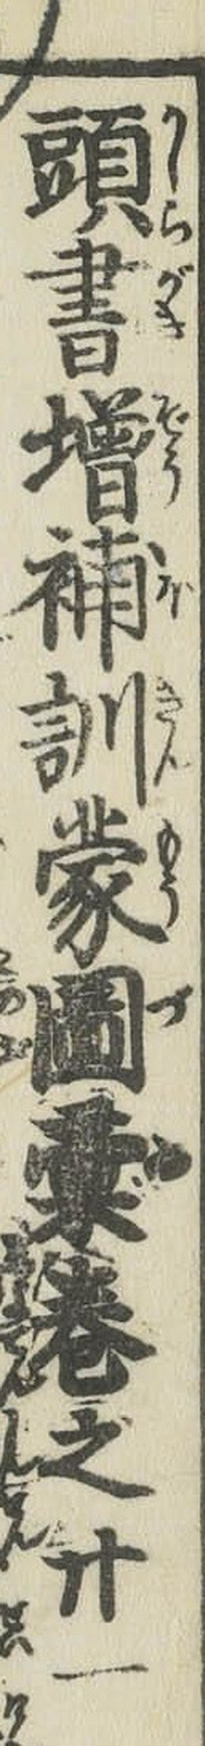頭書増補訓蒙図彙巻之廿一
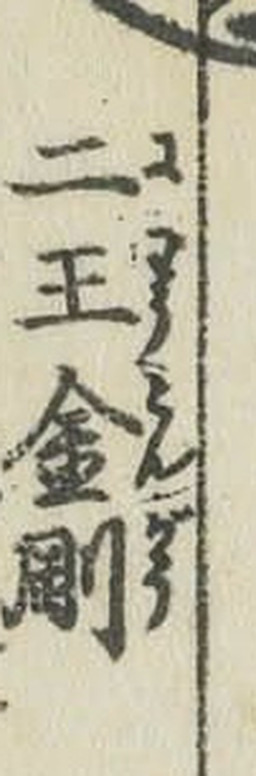二王金剛
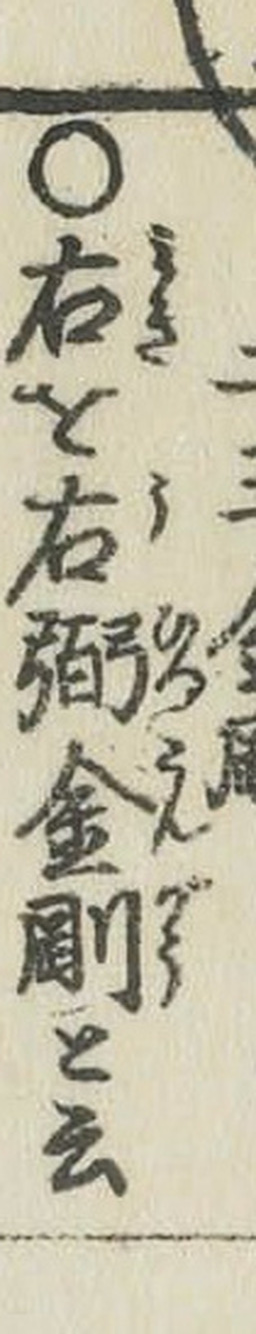○右を右弼金剛と云
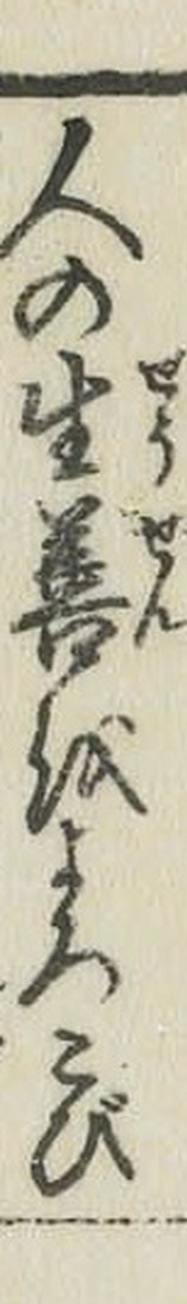人の生善をよろこび
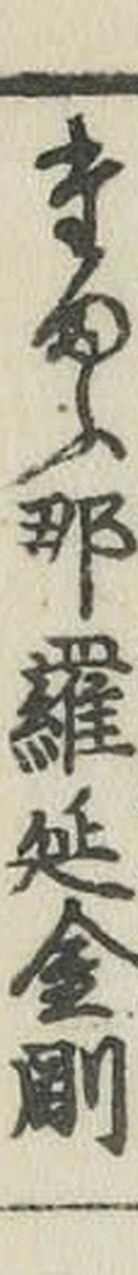たまふ那羅延金剛
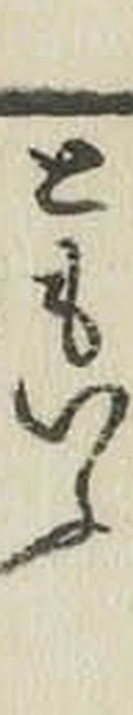ともいふ
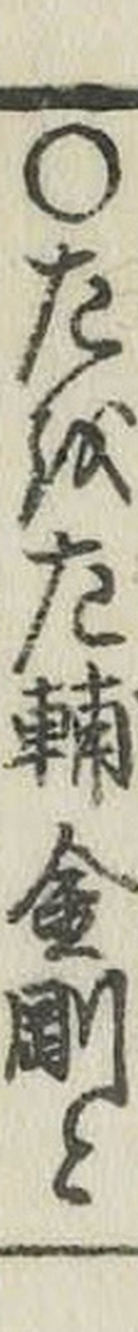○左を左輔金剛と
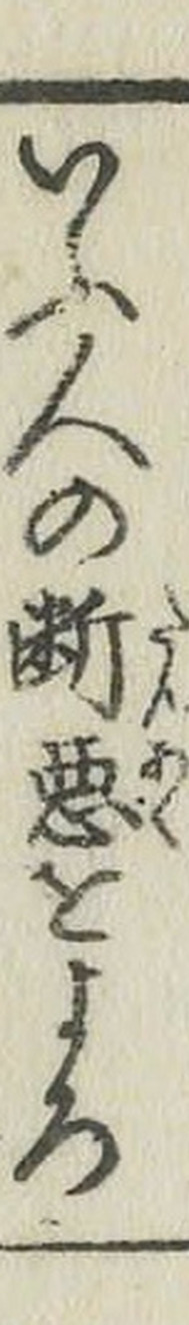いふ人の断悪をよろ
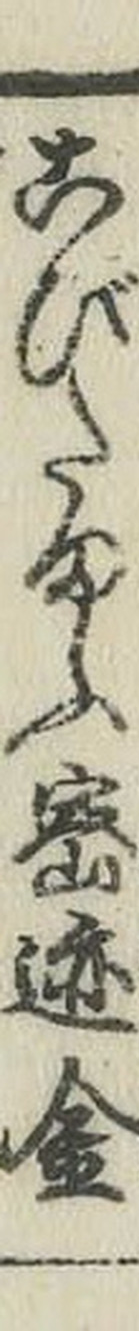こびたまふ密迹金
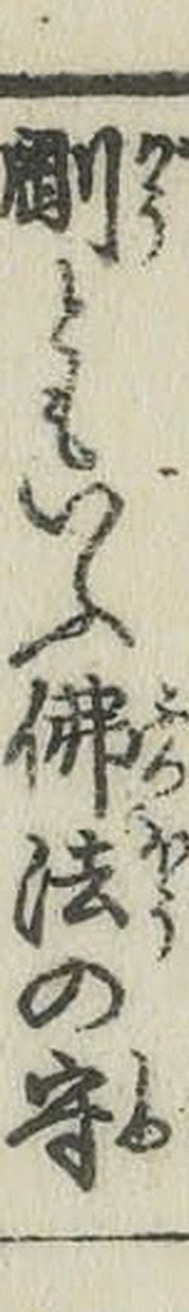剛ともいふ佛法の守
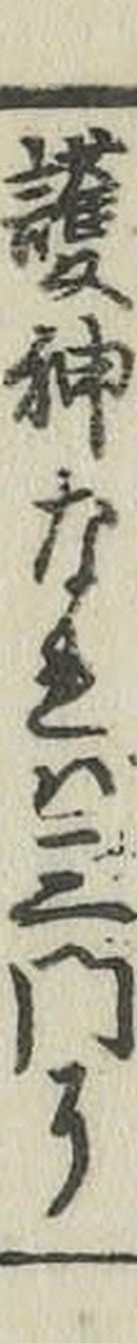護神なれば三門に

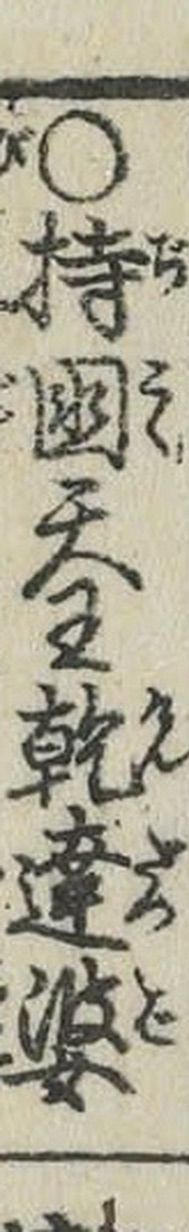○持国天王乾達婆
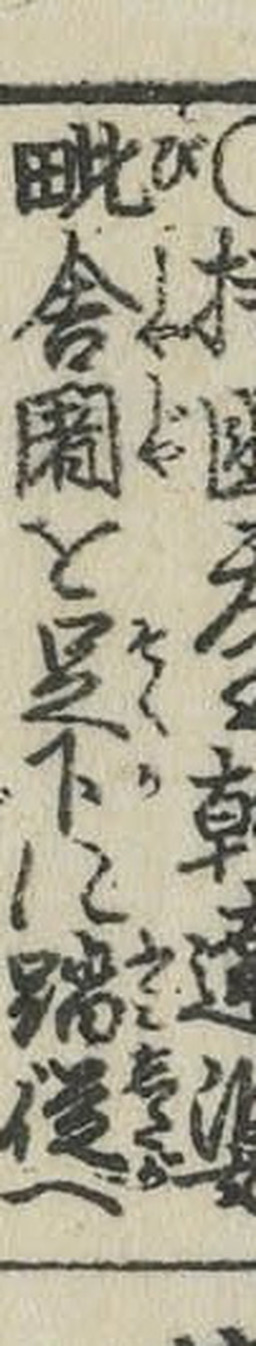毘舎闍を足下に踏従へ
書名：増補頭書訓蒙図彙大成 10巻 10:巻之21
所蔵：東京学芸大学教育コンテンツアーカイブ
